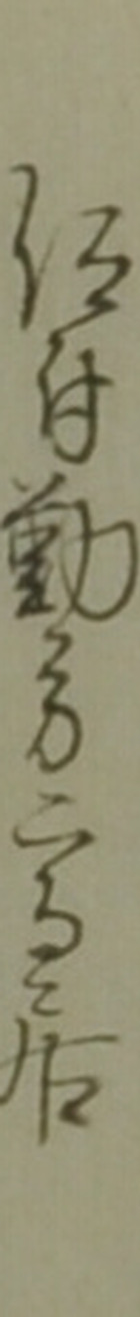仰付勤方高居
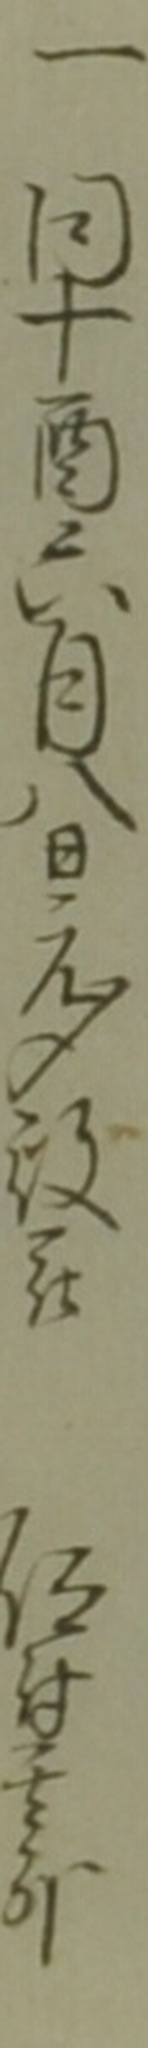一同十酉六月八日元〆役被仰付其外
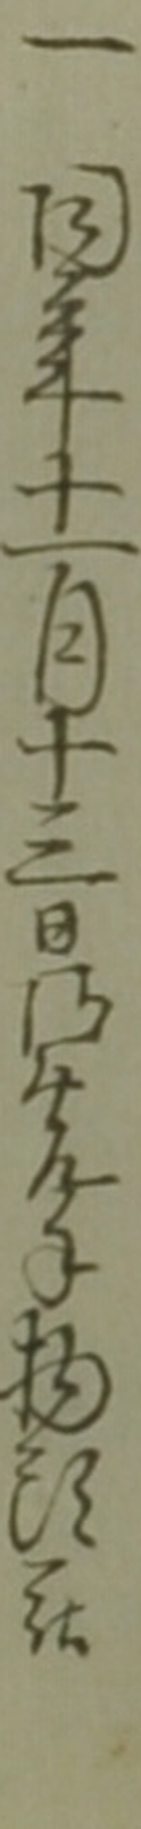一同年十一月十三日御先手物頭被
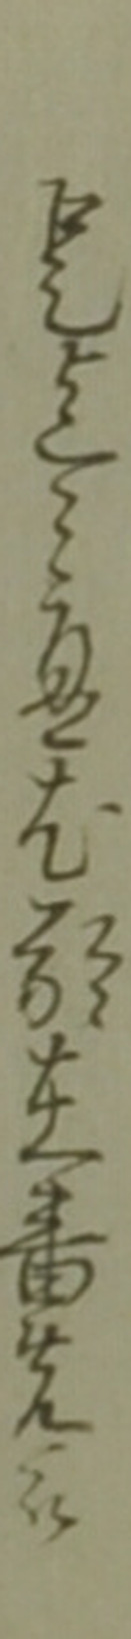是迄之通尤於在番先被仰付
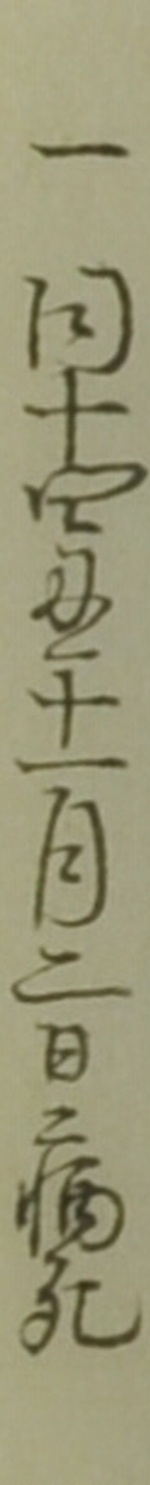一同十四丑十一月二日病死
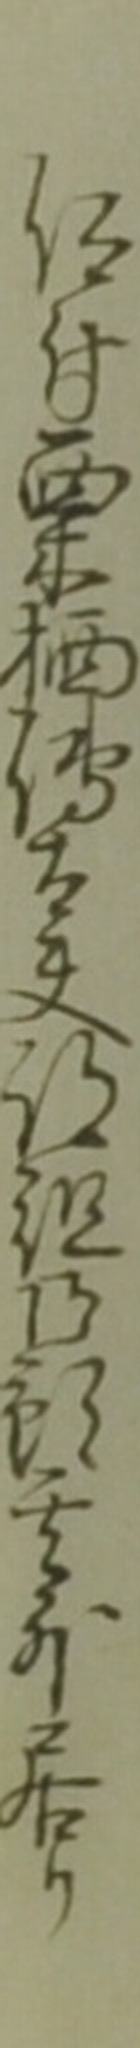仰付栗栖伝太夫跡組御預其外居リ

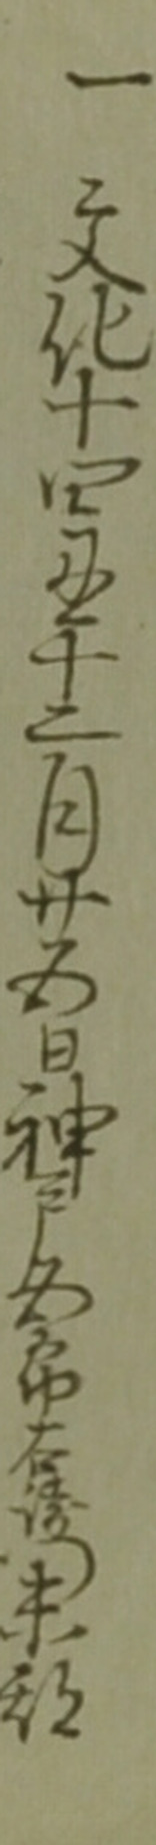一文化十四丑十二月廿五日神戸五郎右衛門末期
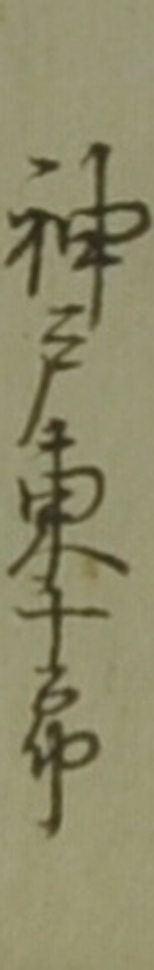神戸東十郎
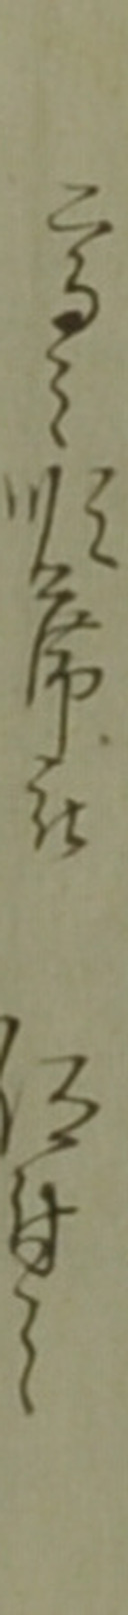高之順席被仰付之
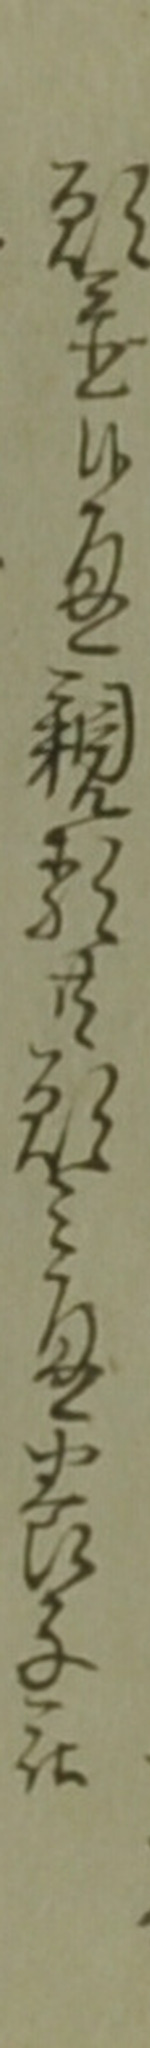願置候通親類共願之通養子被
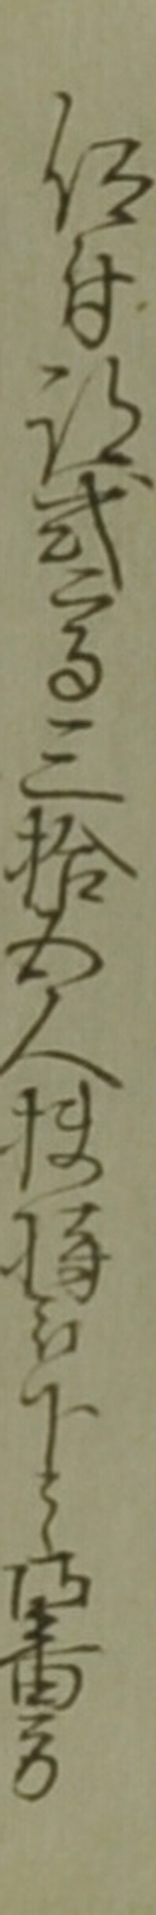仰付跡式高三拾五人扶持被下之御番方
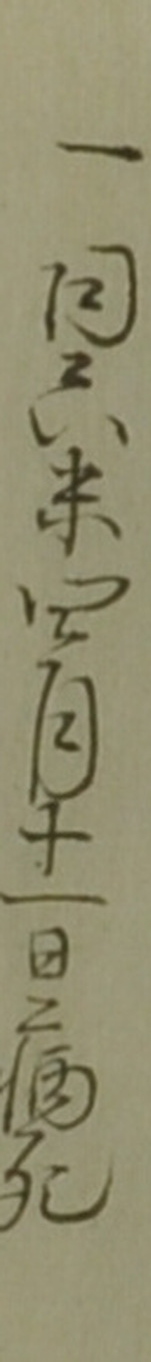一同六未四月十一日病死
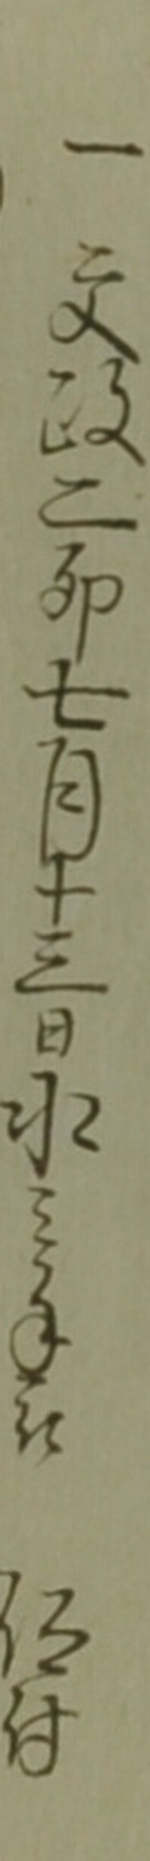一文政二卯七月十三日ｍ水之手被仰付
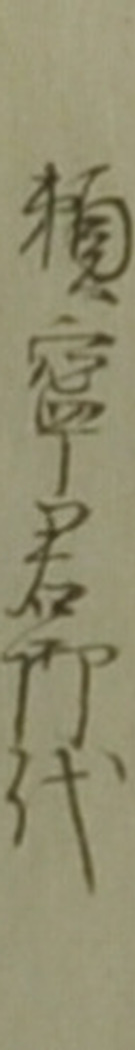頼寧君御代
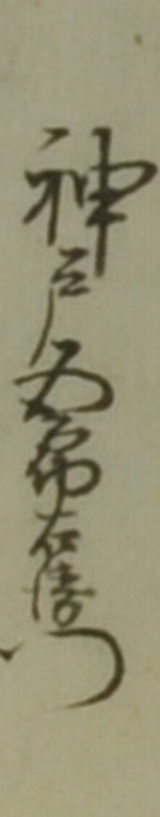神戸五郎右衛門
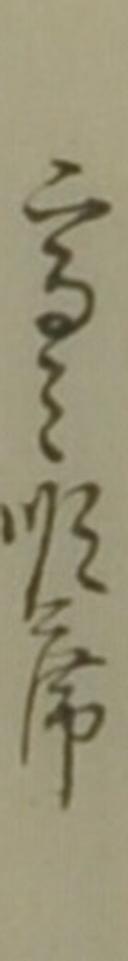高之順席
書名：給人諸士勤仕録（三）
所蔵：伊那市立高遠町図書館・合同会社AMANE
